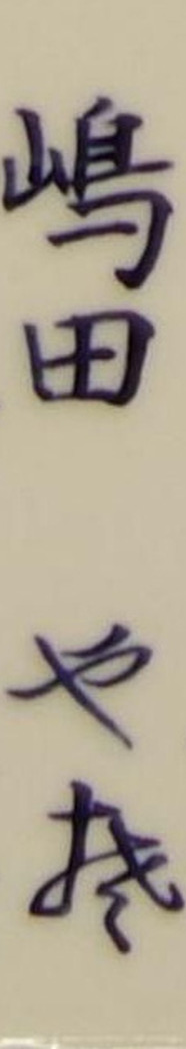嶋田やそ
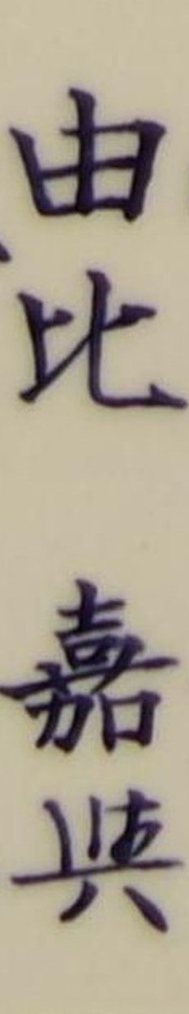由比嘉興
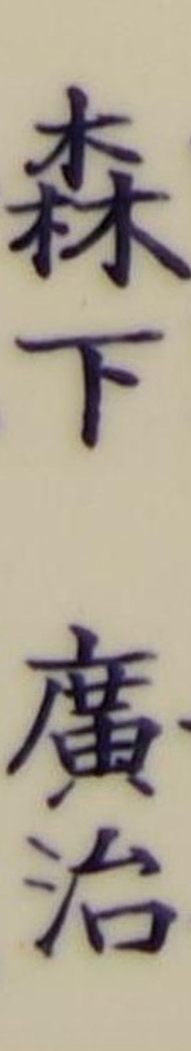森下広治
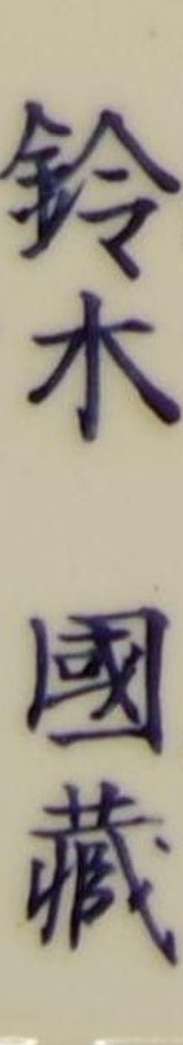鈴木国蔵
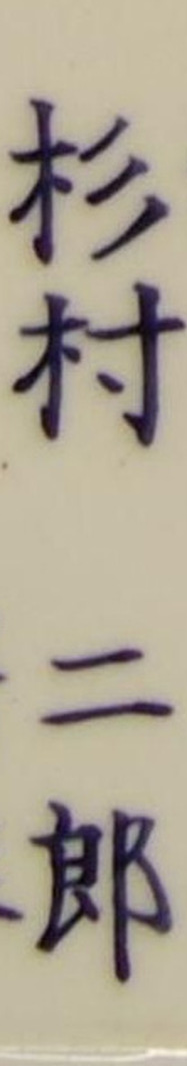杉村二郎
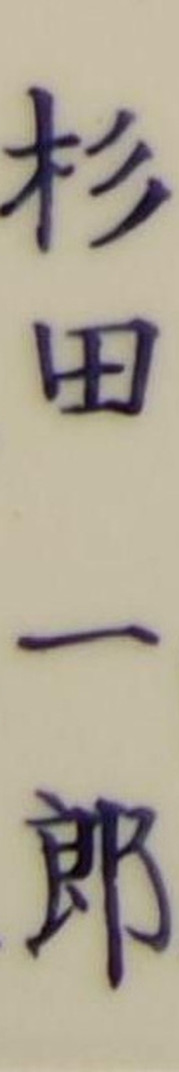杉田一郎
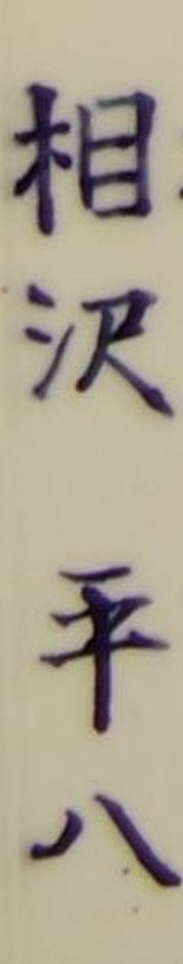相沢平八

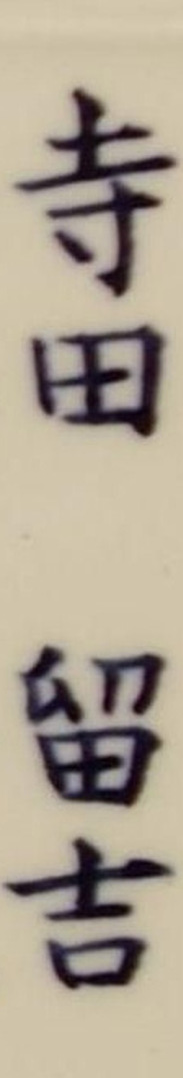寺田留吉
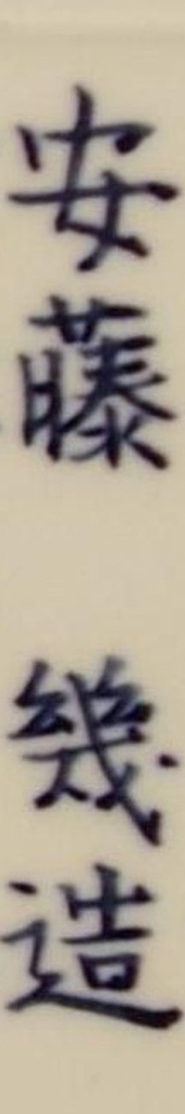安藤幾造
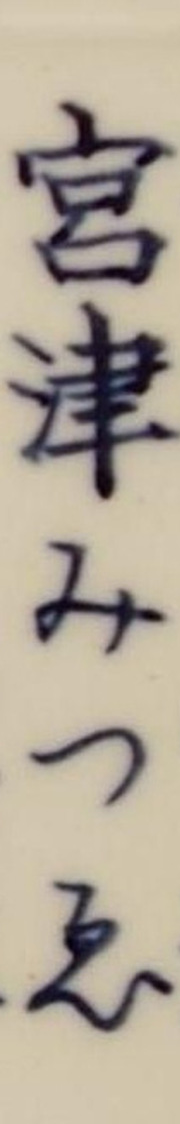宮津みつゑ
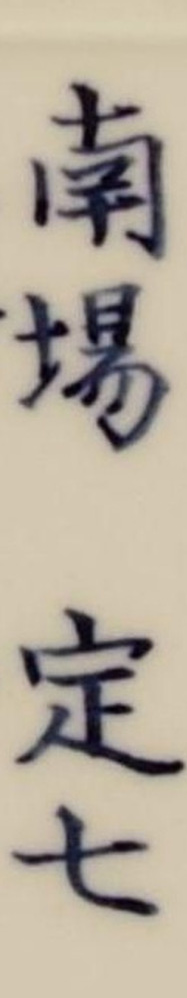南場定七
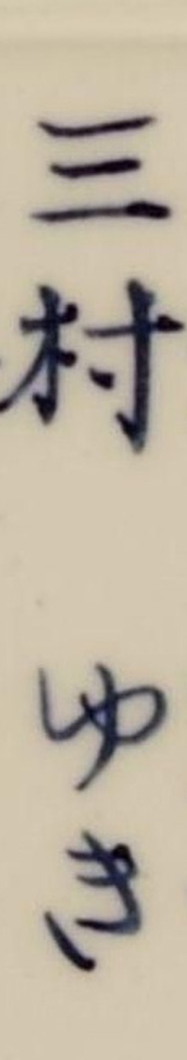三村ゆき
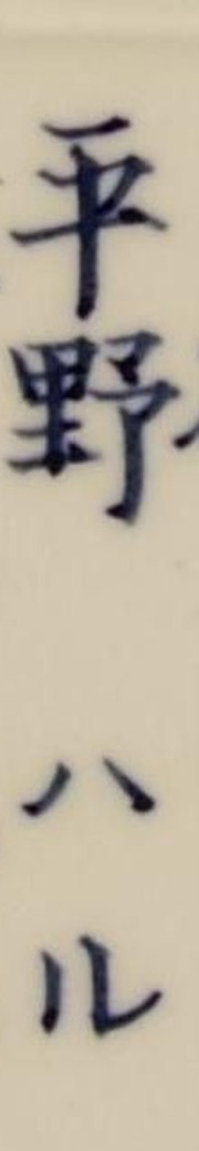平野ハル
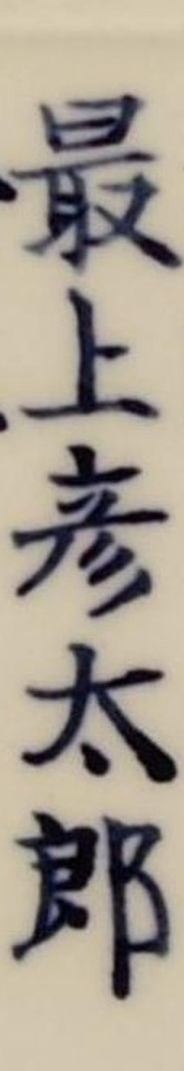最上彦太郎
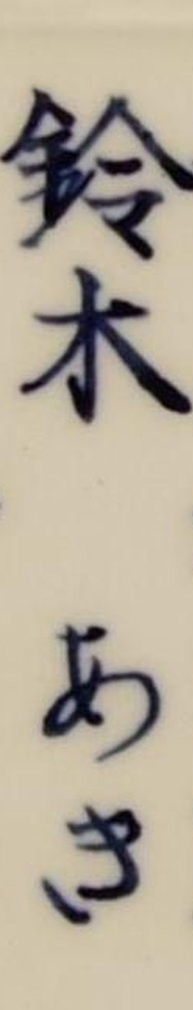鈴木あき
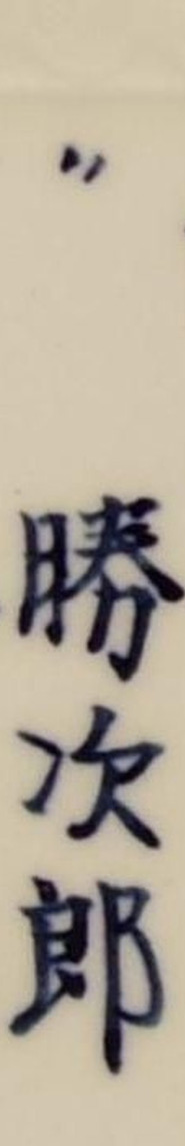勝次郎
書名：A~D
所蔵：koyasan kongobuji
